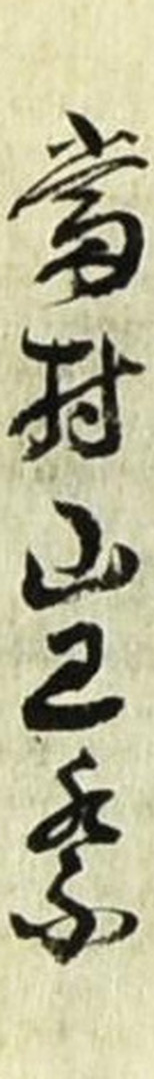当村山王祭
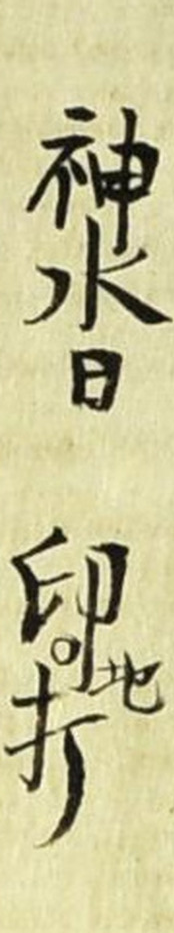神水日印地打
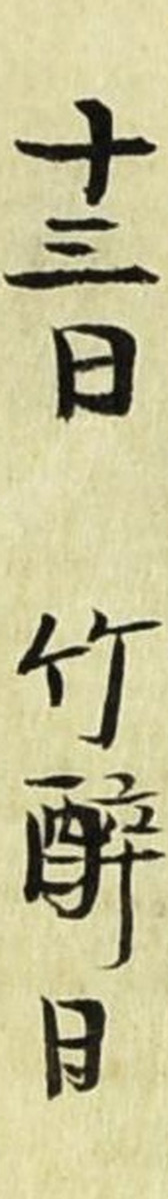十三日竹酔日
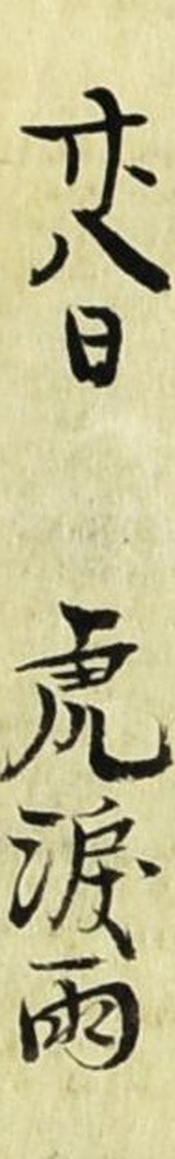二十八日虎涙雨

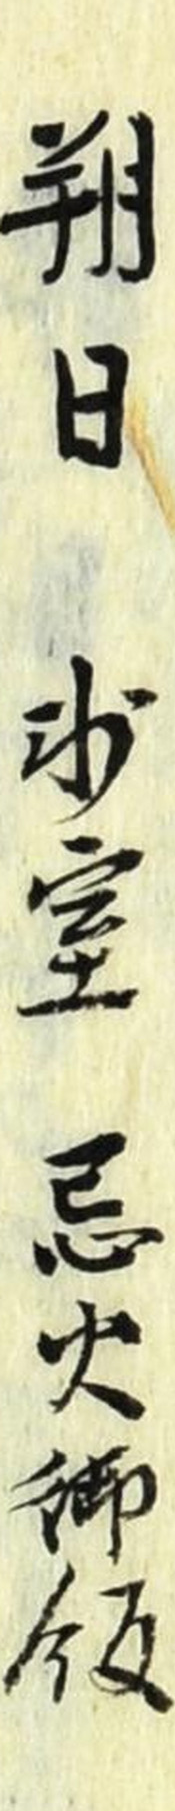朔日氷室忌火御飯
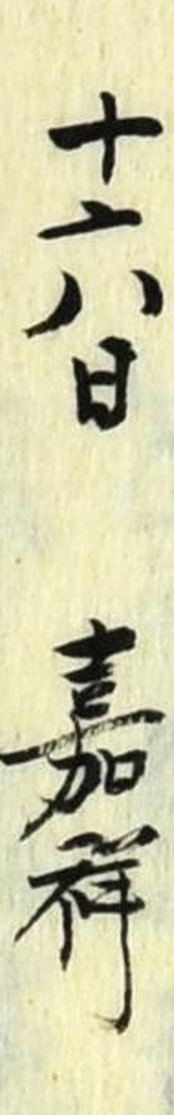十六日嘉祥
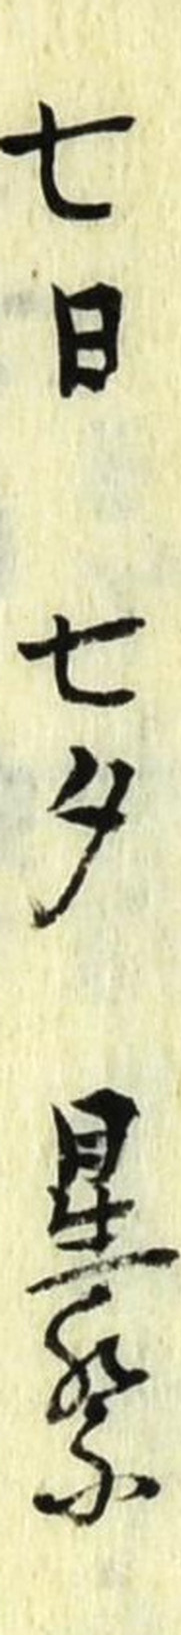七日七夕星祭
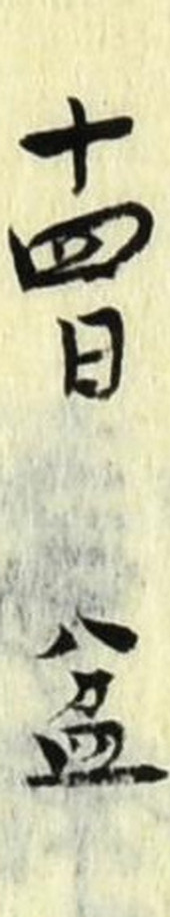十四日盆
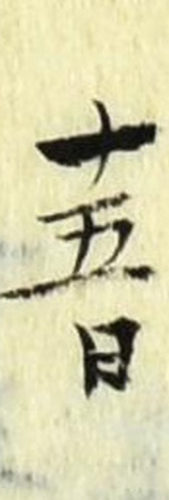十五日
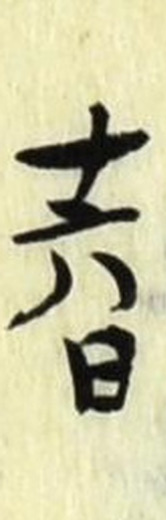十六日
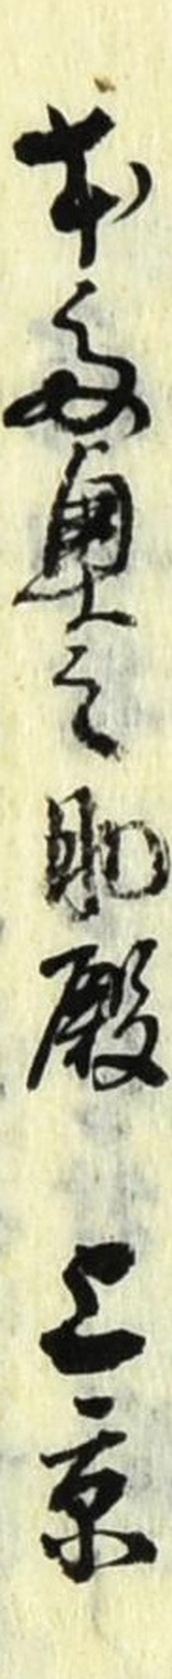本多興之助殿上京

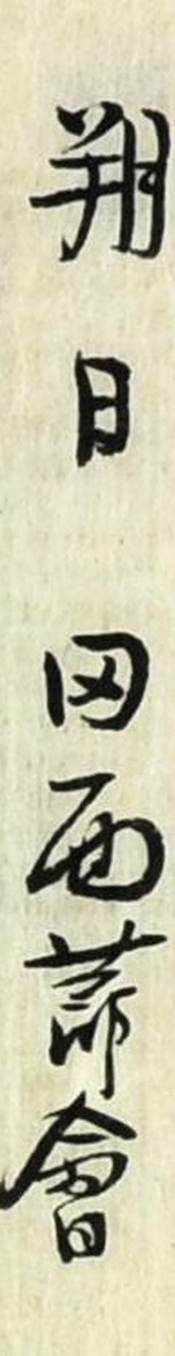朔日田面節会
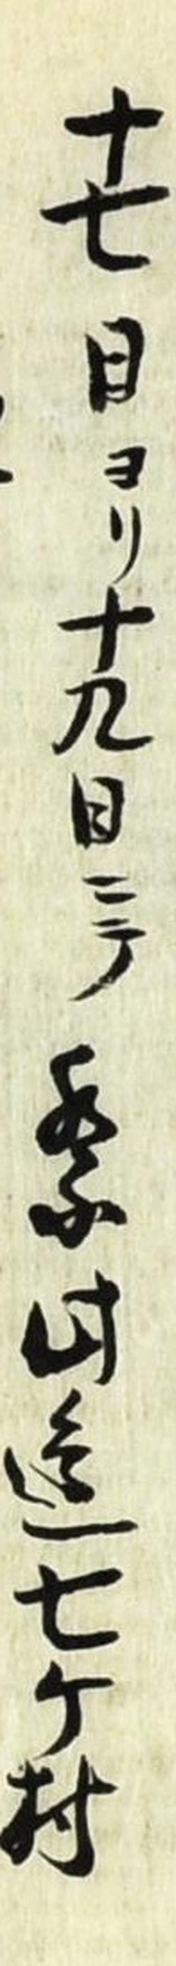十七日より十九日にて祭此辺七ヶ村
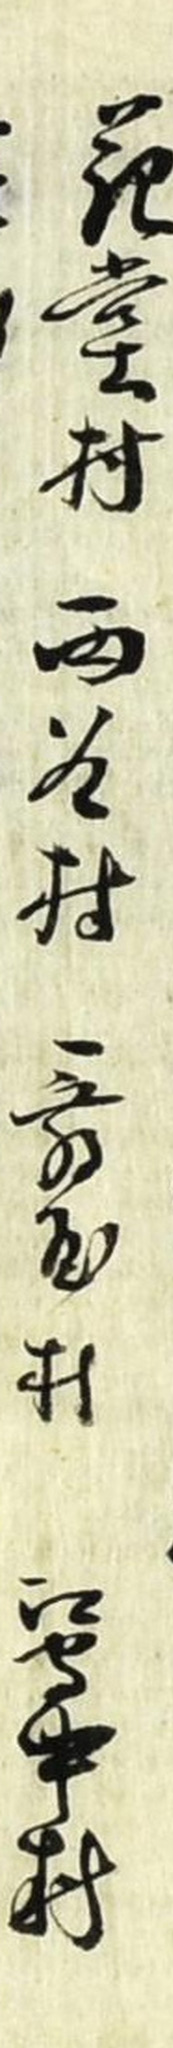花堂村西谷村舞屋村江守中村
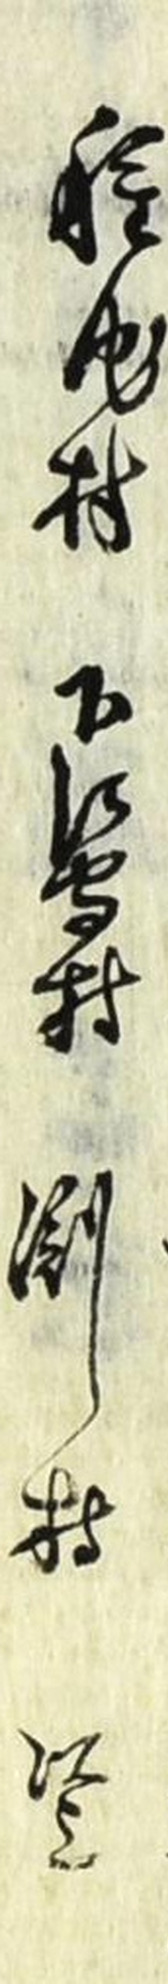種池村下江守村淵村以上
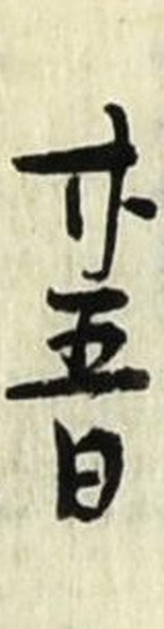廿五日
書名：（日記）
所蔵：福井県文書館 Fukui Prefectural Archives
